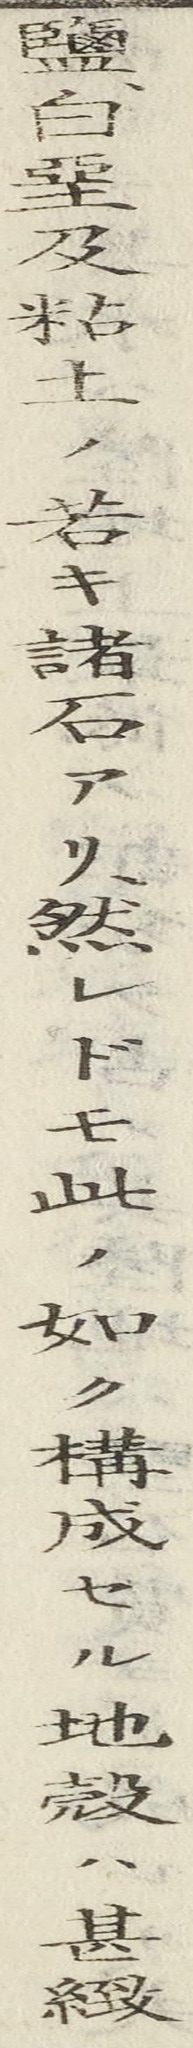塩、白垔及粘土ノ若キ諸石アリ、然レドモ此ノ如ク構成セル地殻ハ甚緻
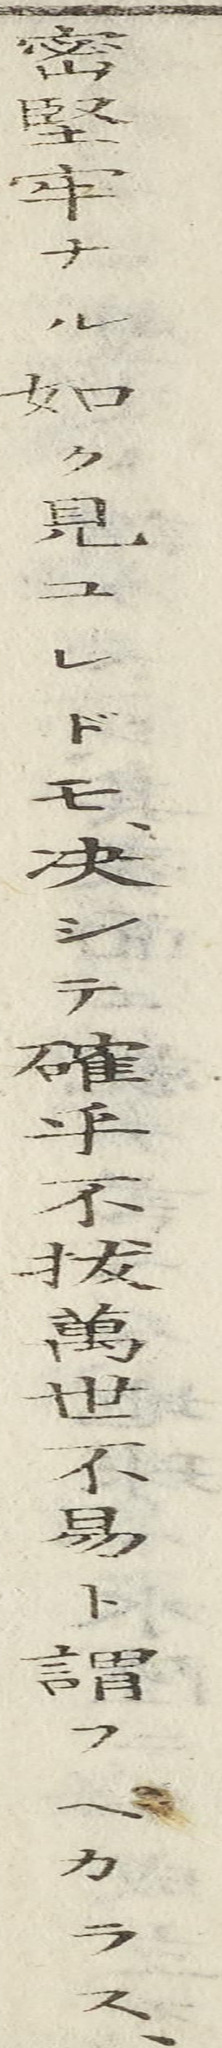密堅牢ナル如ク見ユレドモ、決シテ確乎不抜万世不易ト謂フヘカラス、
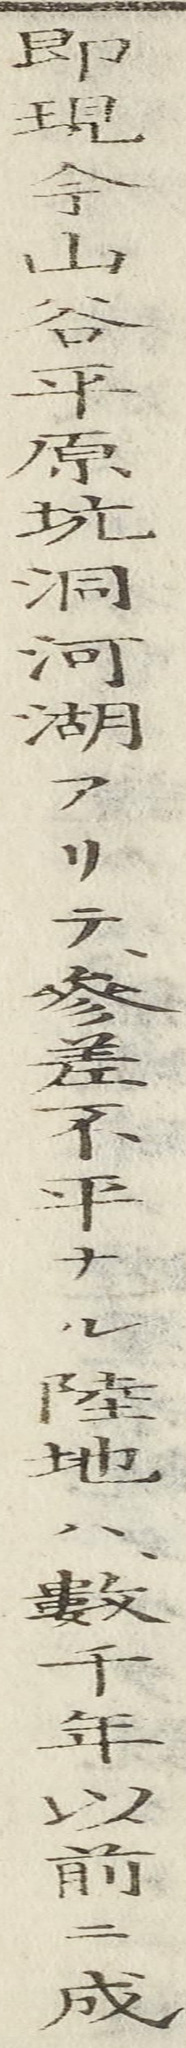即現今山谷平原坑洞河湖アリテ、参差不平ナル陸地ハ、数千年以前ニ成
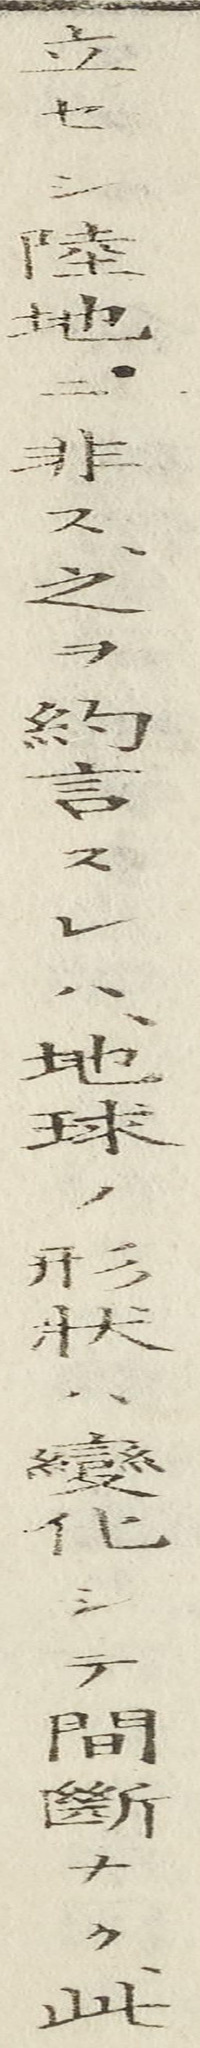立セシ陸地ニ非ス、之ヲ約言スレハ、地球ノ形状ハ変化シテ間断ナク、此
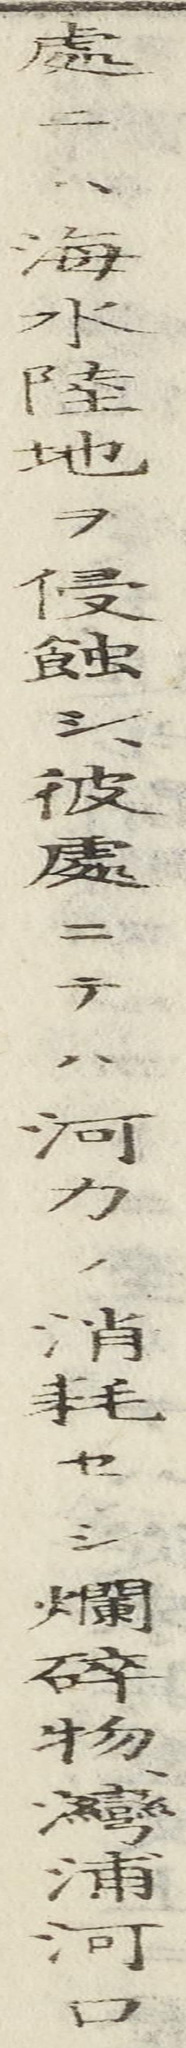処ニハ海水陸地ヲ侵蝕シ、彼処ニテハ河力ノ消セシ爛砕物、湾浦河口
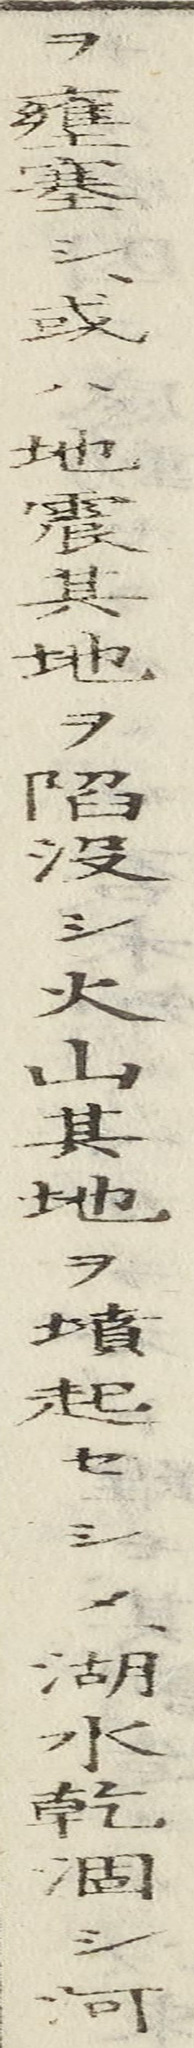ヲ壅塞シ、或ハ地震其地ヲ陥没シ火山其地ヲ墳起セシメ、湖水乾涸シ河
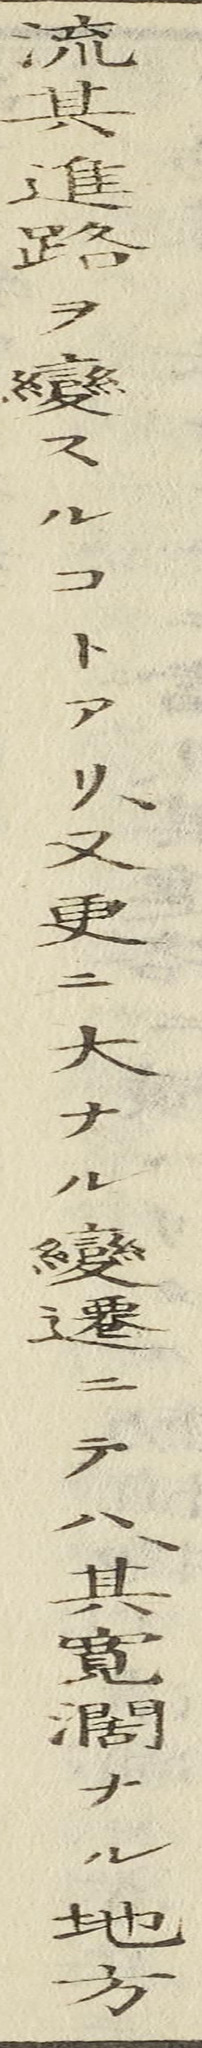流其進路ヲ変スルコトアリ、又更ニ大ナル変遷ニテハ、其寛濶ナル地方
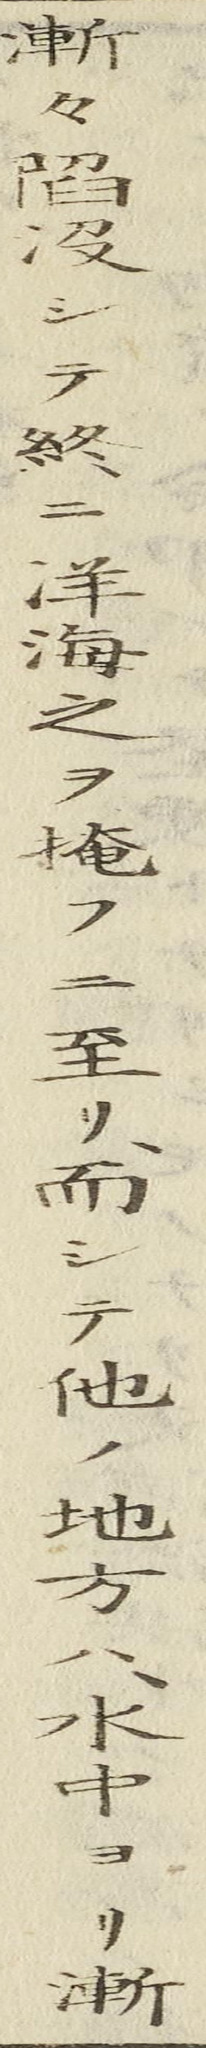漸々陥没シテ終ニ洋海之ヲ掩フニ至リ、而シテ他ノ地方ハ、水中ヨリ漸
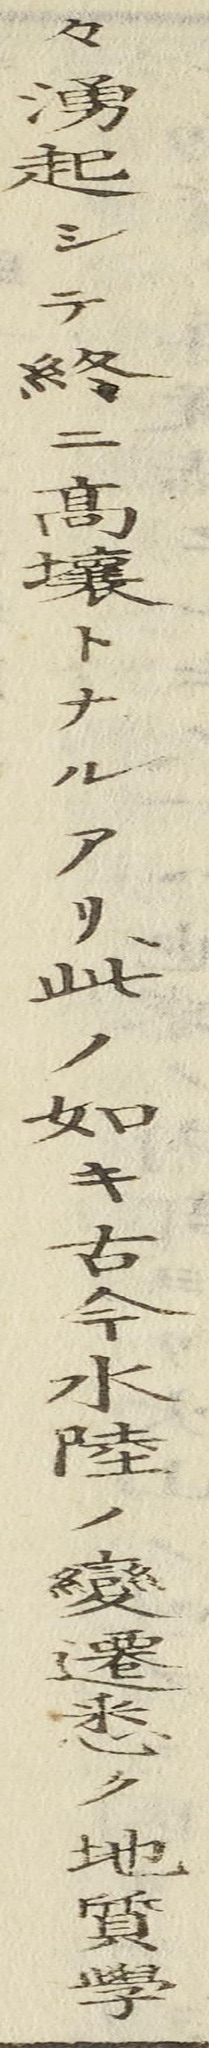々湧起シテ終ニ高壌トナルアリ、此ノ如キ古今水陸ノ変遷悉ク地質学
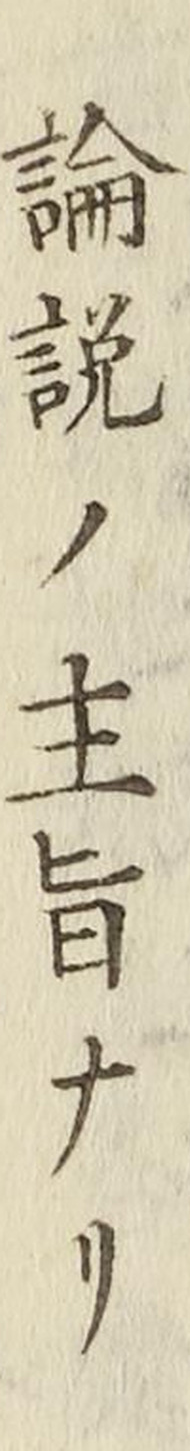論説ノ主旨ナリ
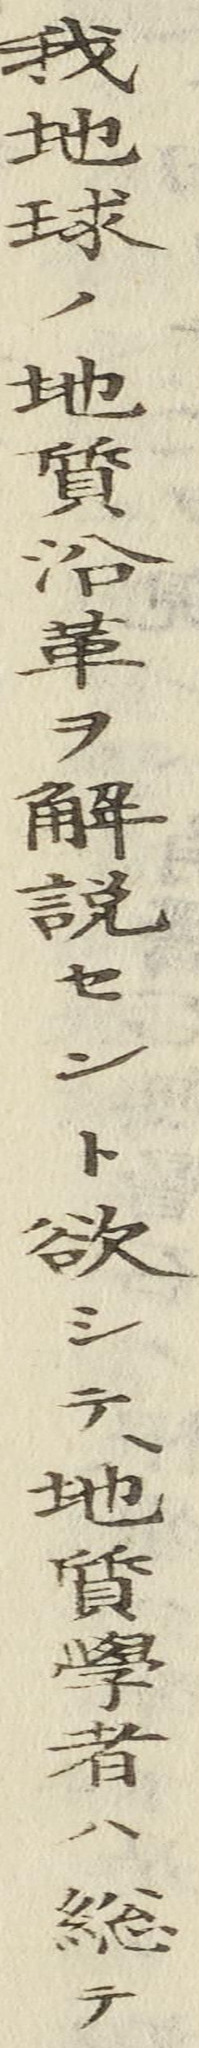我地球ノ地質沿革ヲ解説セント欲シテ、地質学者ハ総テ
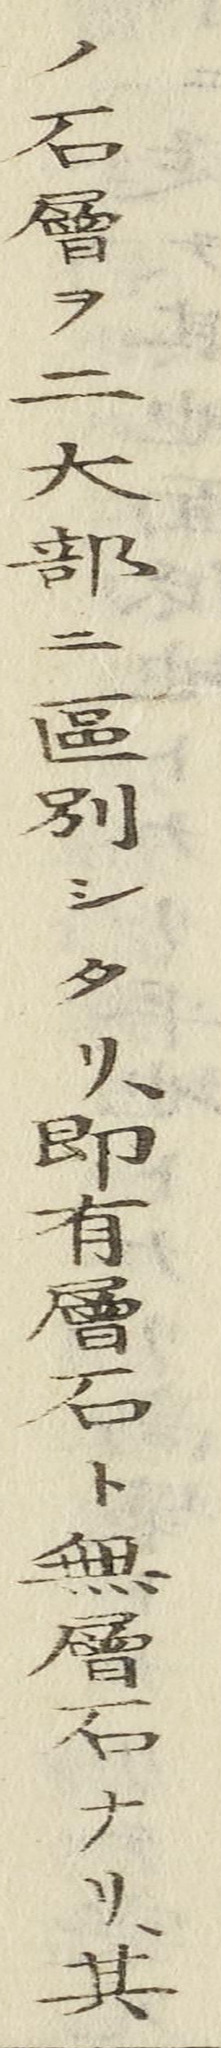ノ石層ヲ二大部ニ区別シタリ、即有層石ト無層石ナリ、其
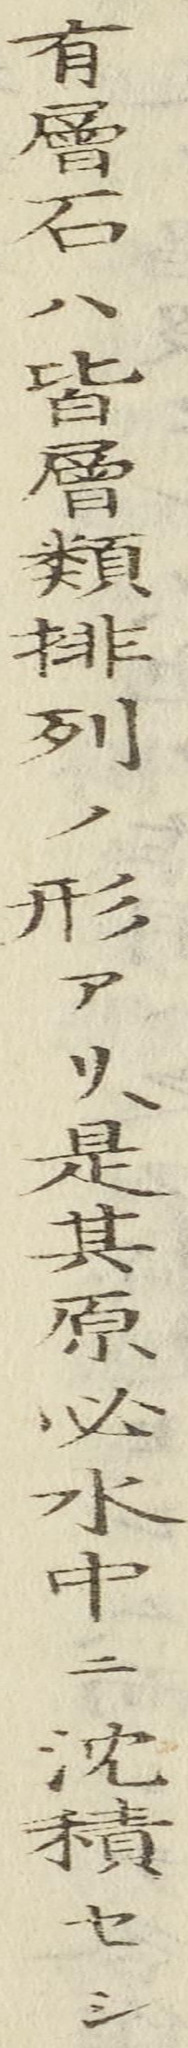有層石ハ皆層類排列ノ形アリ、是其原必水中ニ沈積セシ
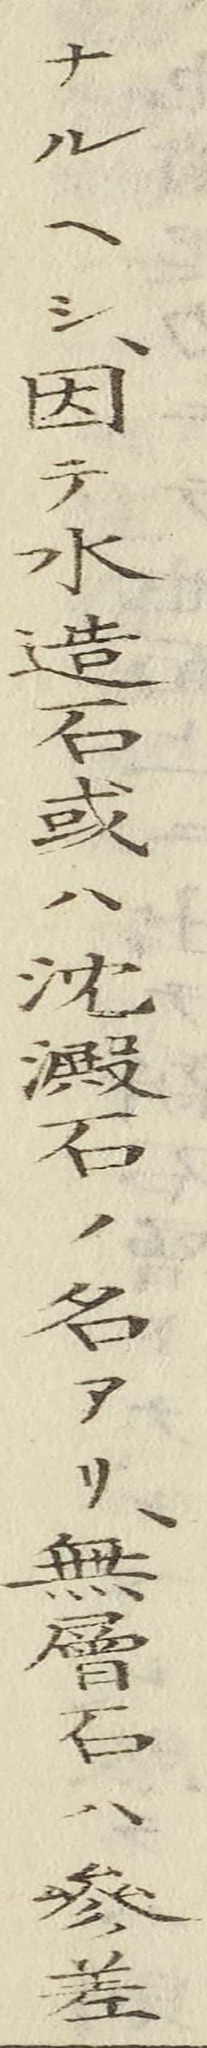ナルヘシ、因テ水造石或ハ沈殿石ノ名アリ、無層石ハ参差
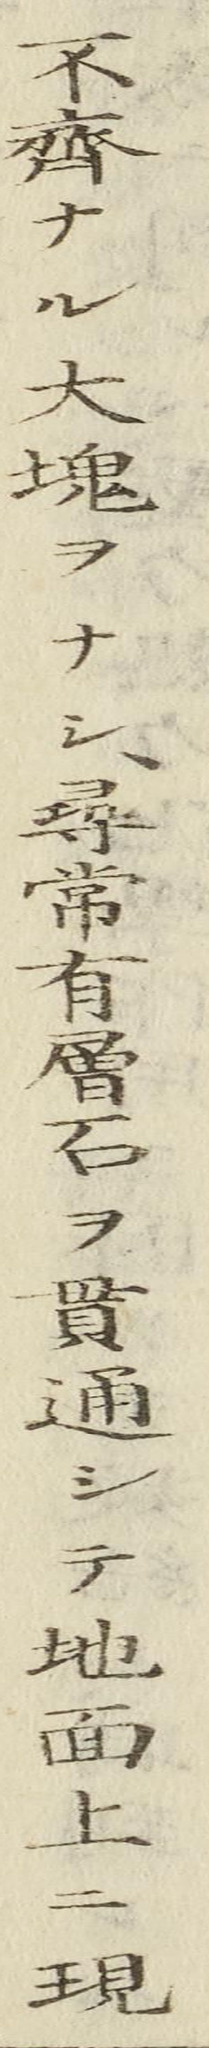不斉ナル大塊ヲナシ、尋常有層石ヲ貫通シテ地面上ニ現
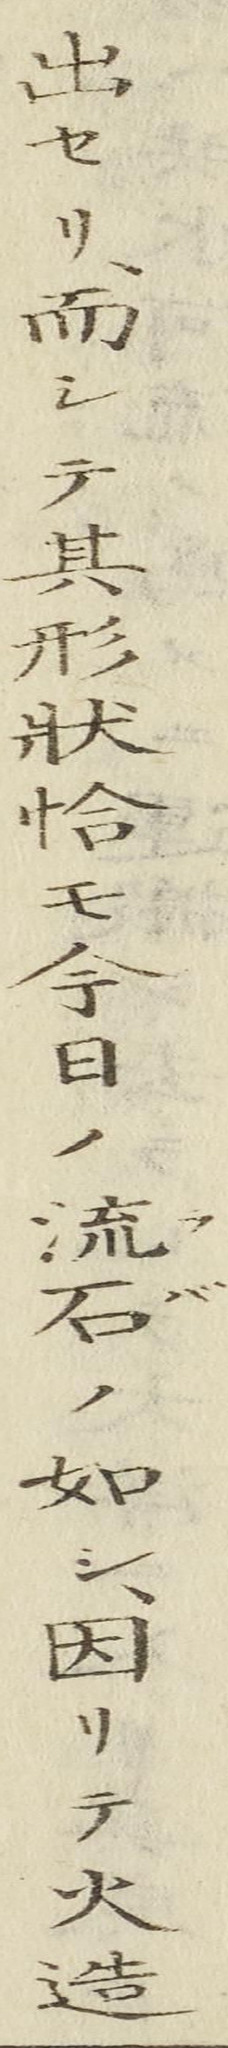出セリ、而シテ其形状恰モ今日ノ流石ノ如シ、因リテ火造
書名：百科全書　地文學　全
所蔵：東京大学地震研究所図書室 Earthquake Research Institute Library, The University of Tokyo, JAPAN
